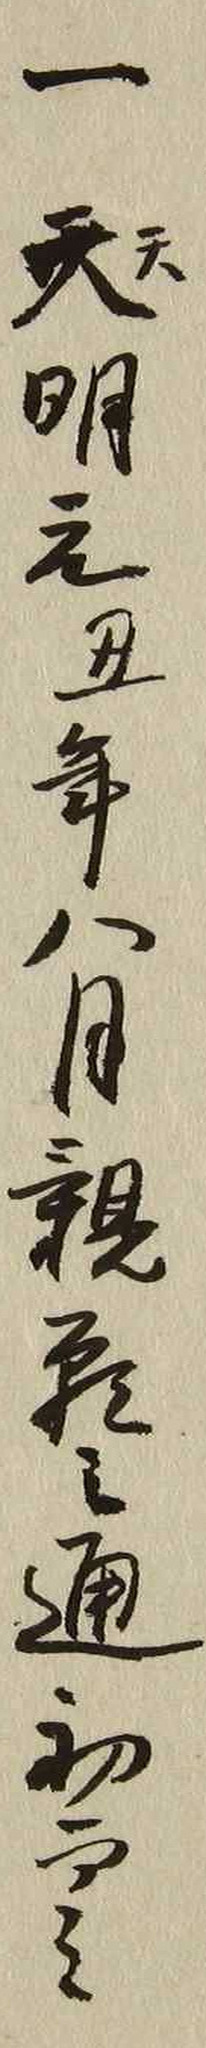一天明元丑年八月親願之通初而之
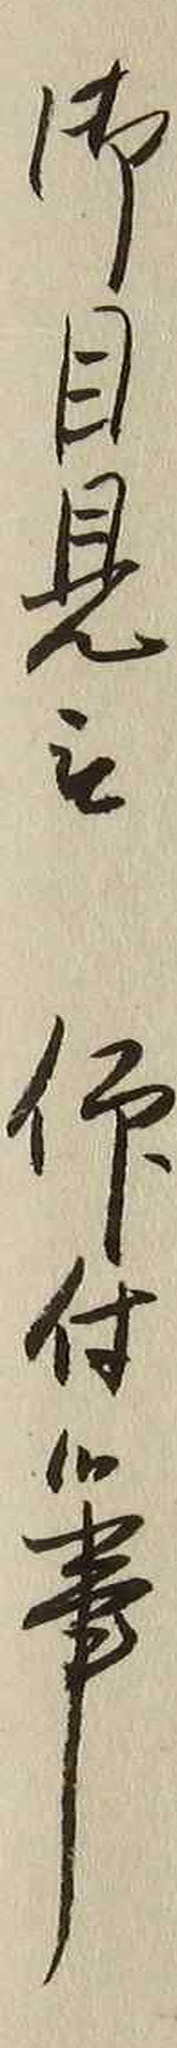御目見被仰付候事
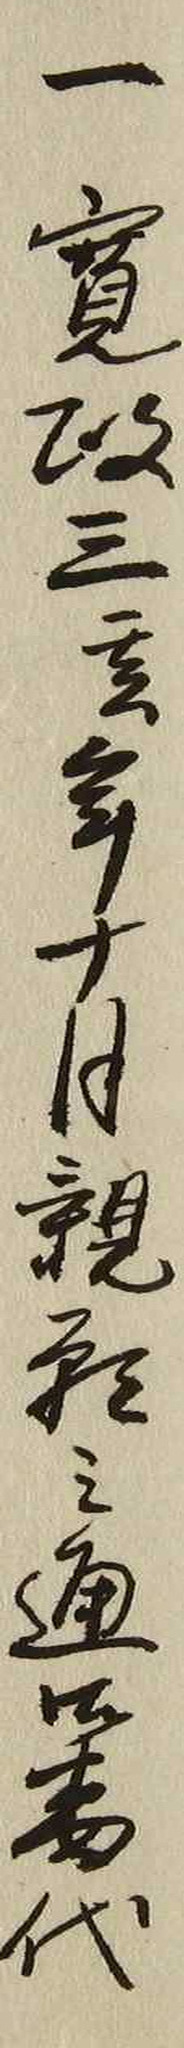一寛政三亥年十月親願之通御番代
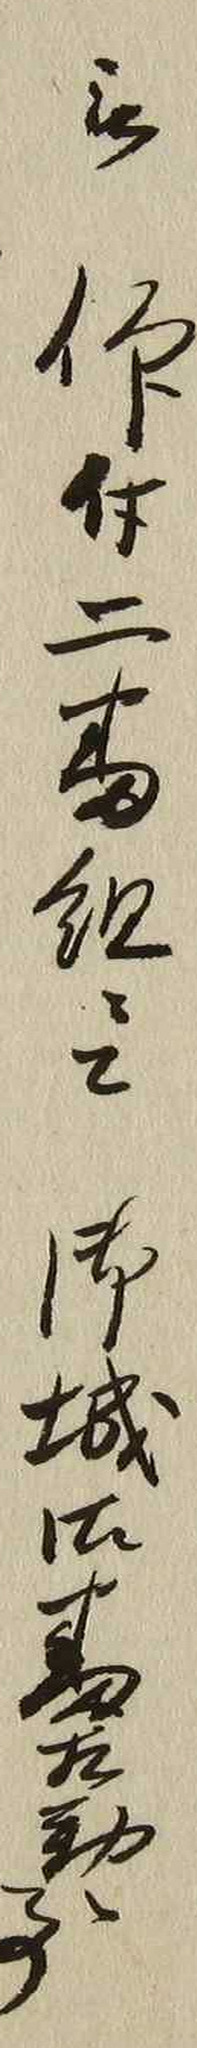被仰付二番組ニて御城御番相勤候事
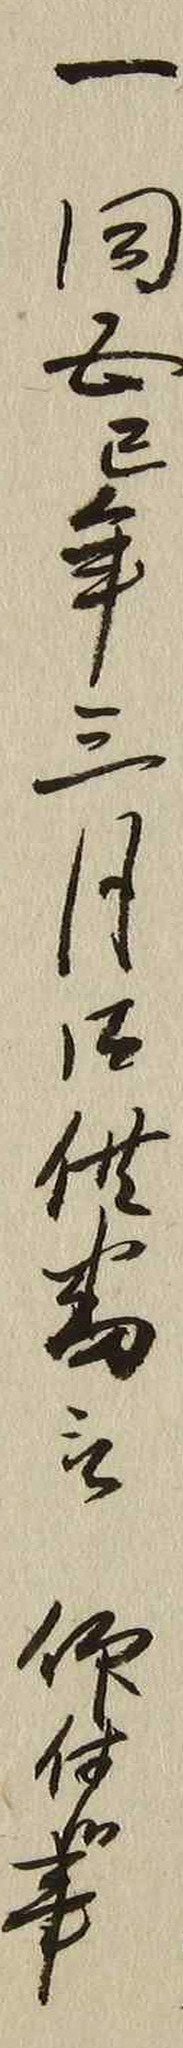一同五巳年三月御供番被仰付候事
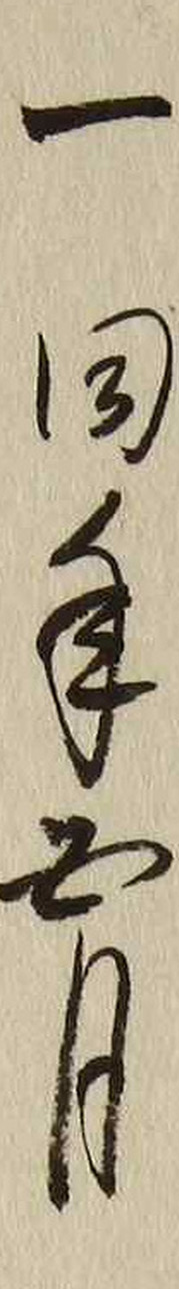一同年五月
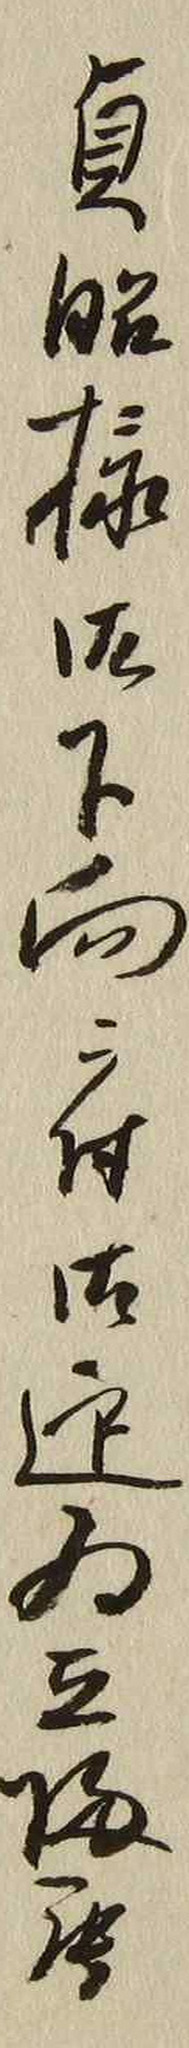貞昭様御下向ニ付御迎為立帰罷
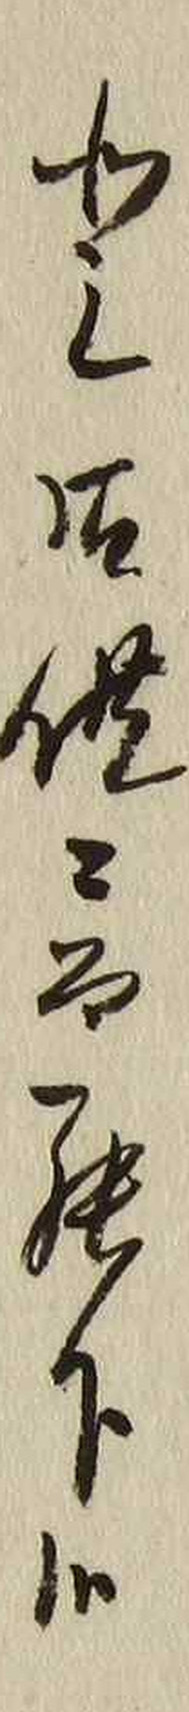登御供ニ而罷下候
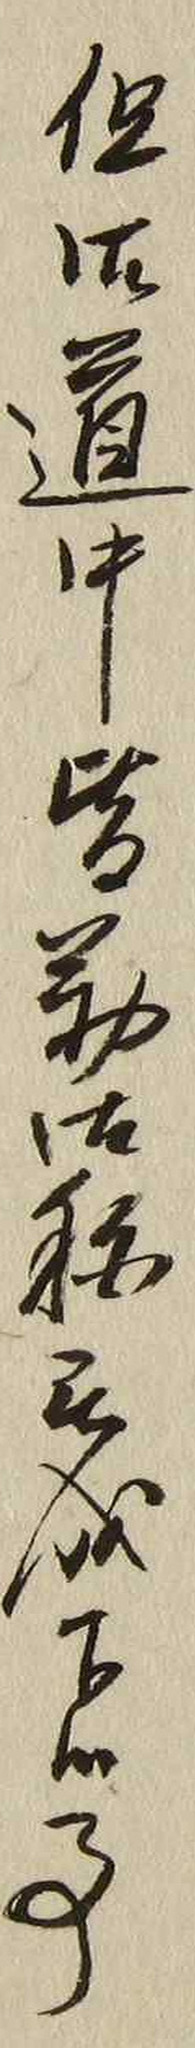但御道中皆勤御称被成下候事
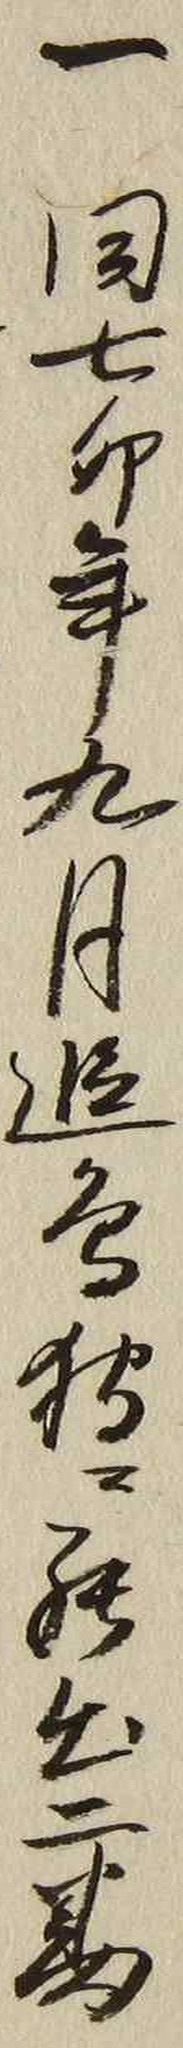一同七卯年九月追鳥狩ニ罷出二番
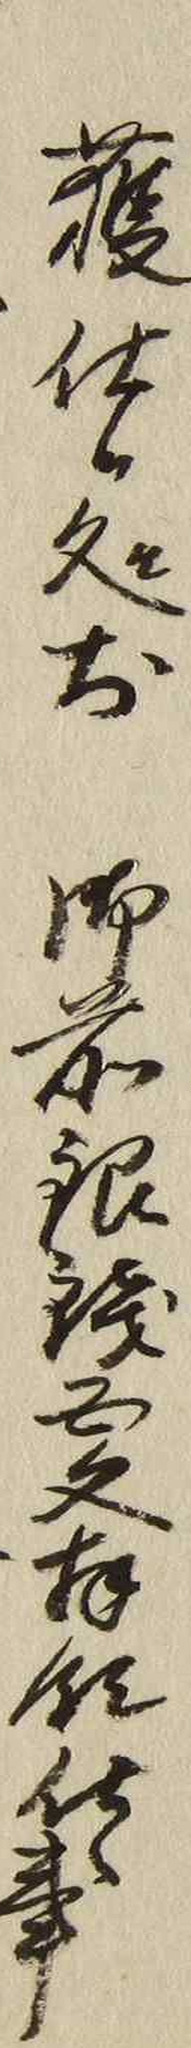獲仕候処於御前銀銭五文拝領仕候事
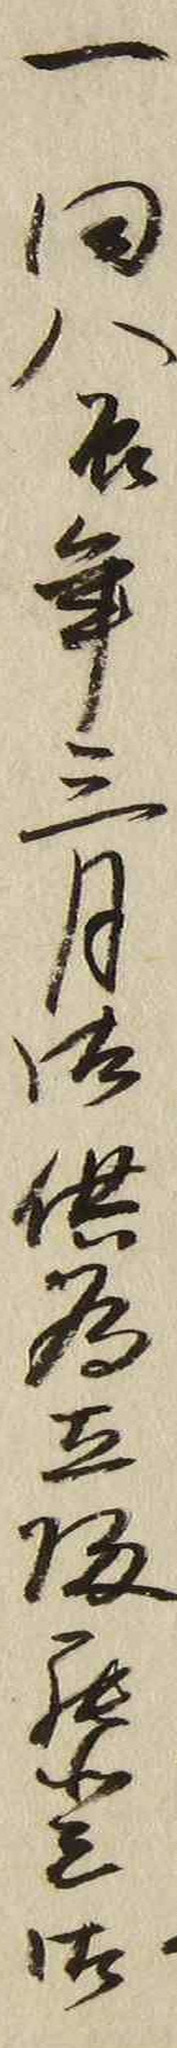一同八辰年三月御供為立帰罷登御

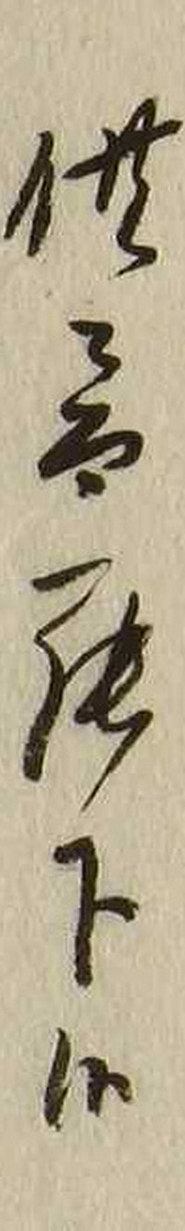供ニ而罷下候
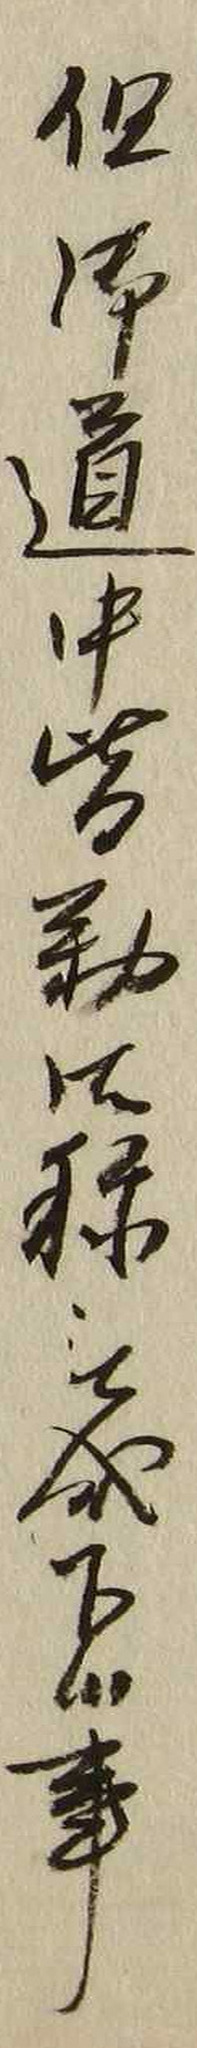但御道中皆勤御称被成下候事
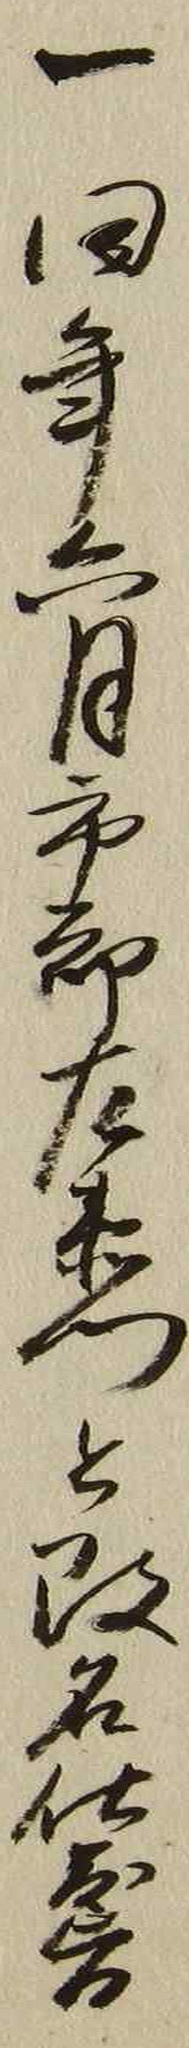一同年六月市郎左衛門と改名仕度旨
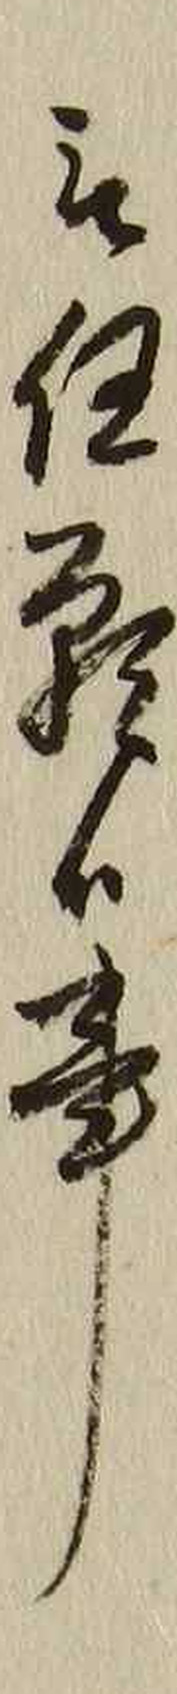被任願候事
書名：諸士系譜　巻之346　も之部2
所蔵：会津若松市立会津図書館
